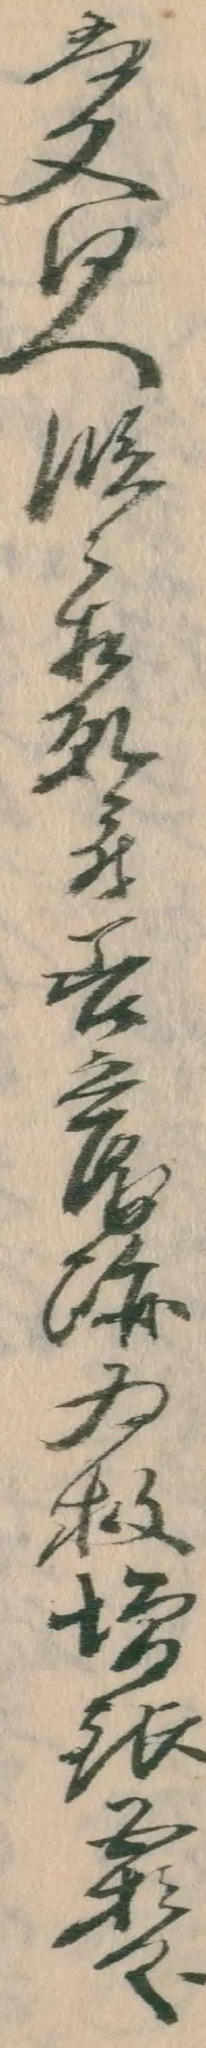尚又同人段々相願候付善兵衛跡為救増銀五拾匁
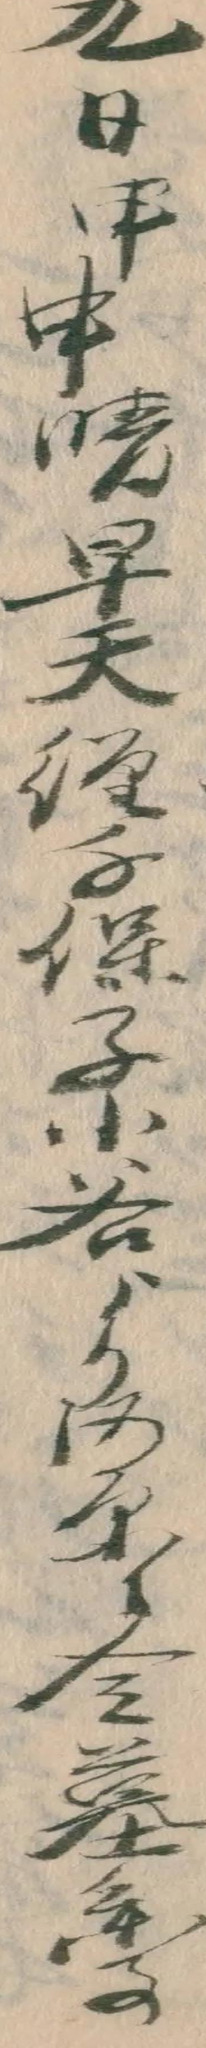九日甲申晴早天経千保子小谷より河原へ令墓参事
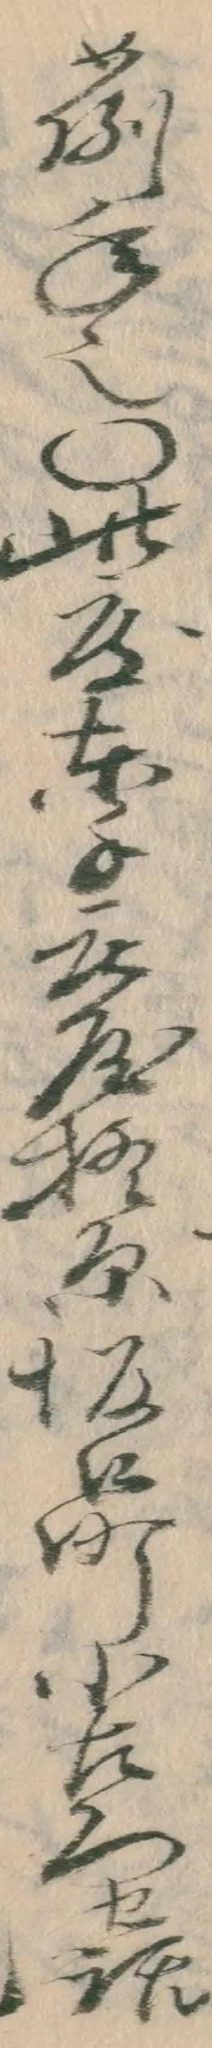如例年也○此度東手庄屋柊原坂口町小左衛門世話
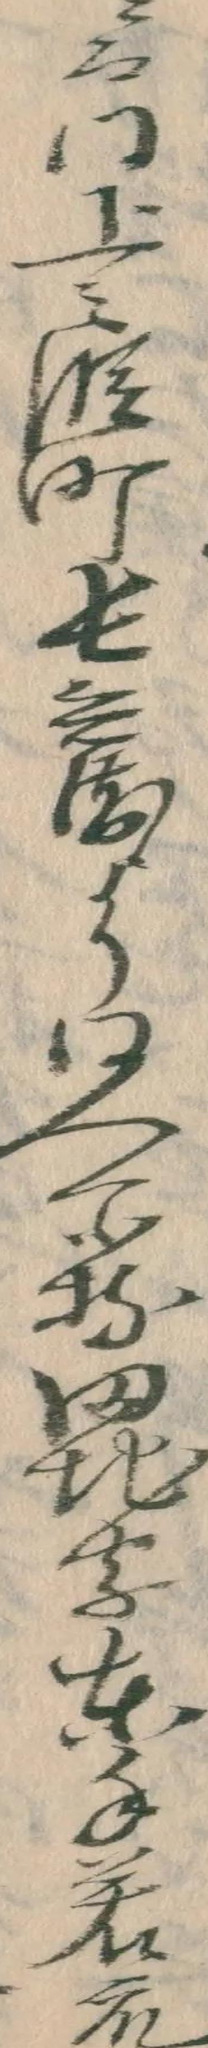二而同上之段町長兵衛より同人所持田地處東手若衆
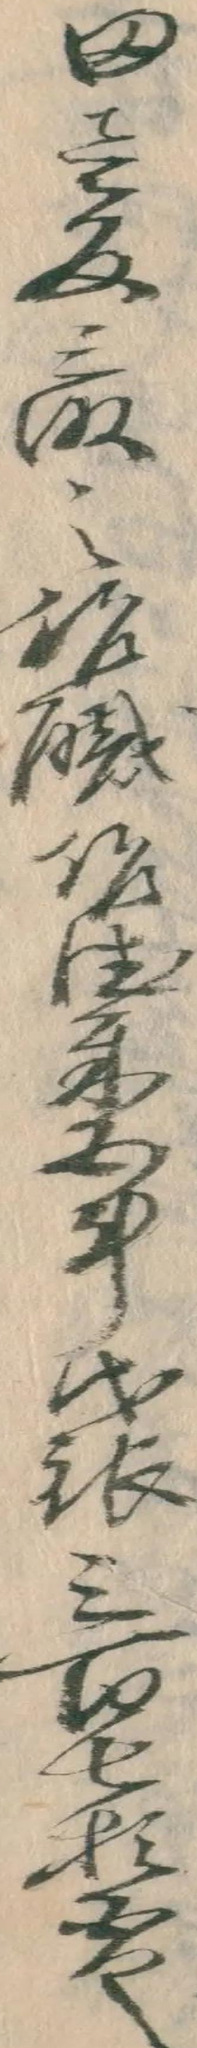田壱反三畝之銀職作徳来五斗代銀三百七拾五匁
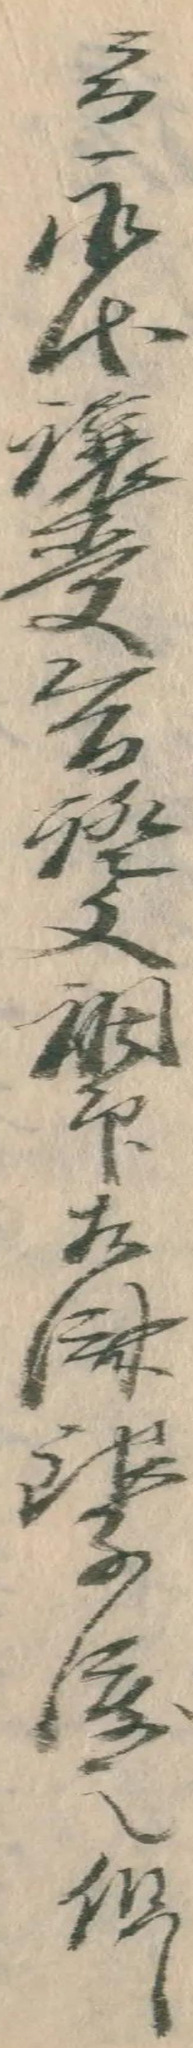ニ而永代譲受今日證文調印相済銀子渡之但し
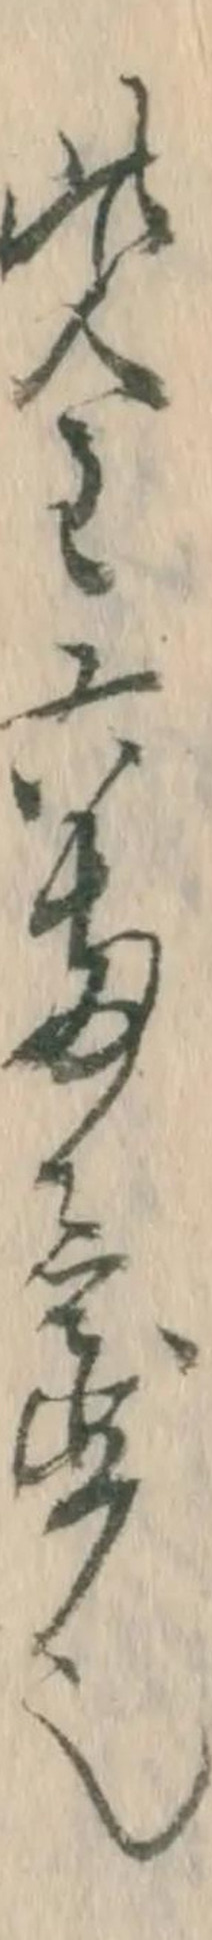此金六両壱歩也
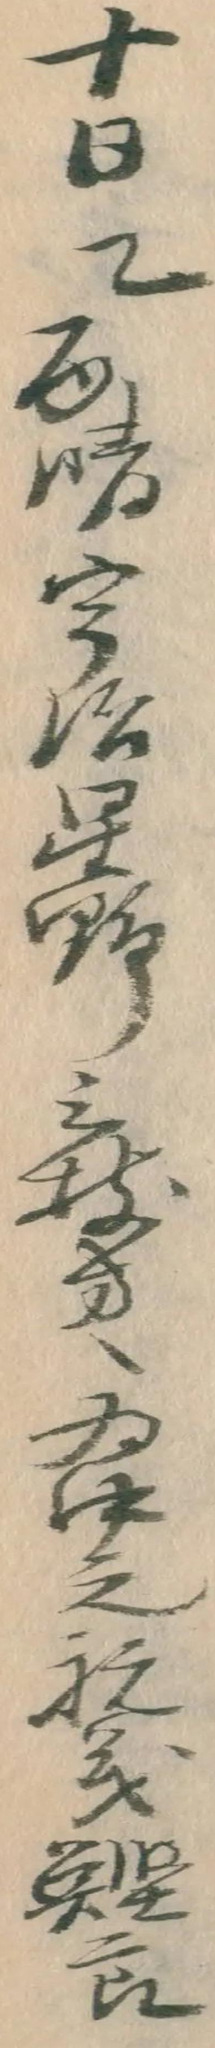十日乙酉晴宇治星野三枝方へ為仕之祝義鰹節

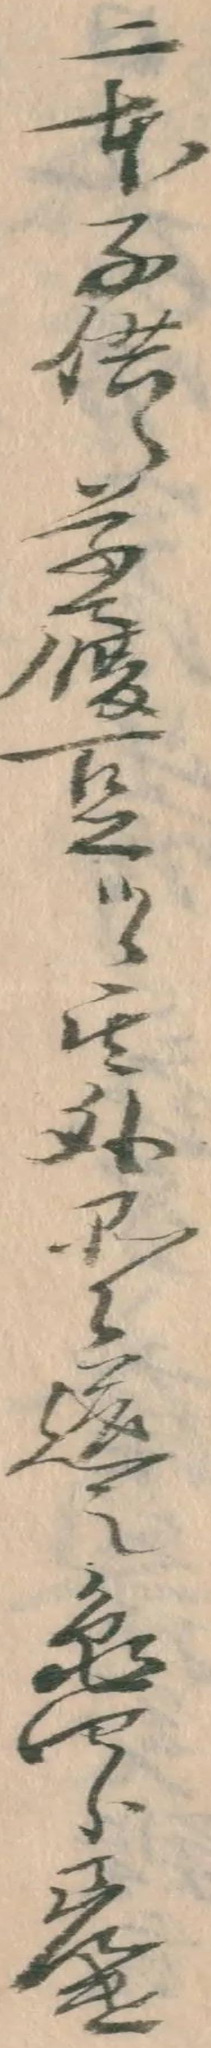二本子供之草履一足ツヽ其外品々送之か亀四郎差遣
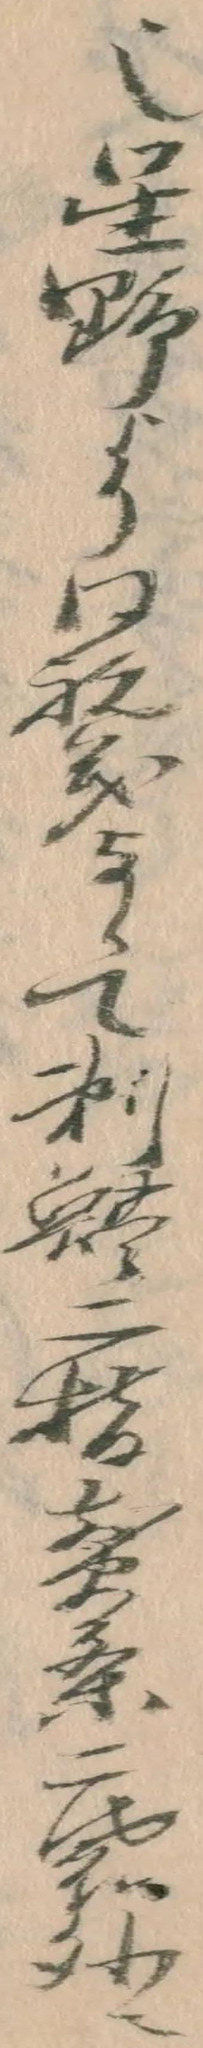也星野より同祝義として刺鯖二指煎茶二袋外ニ
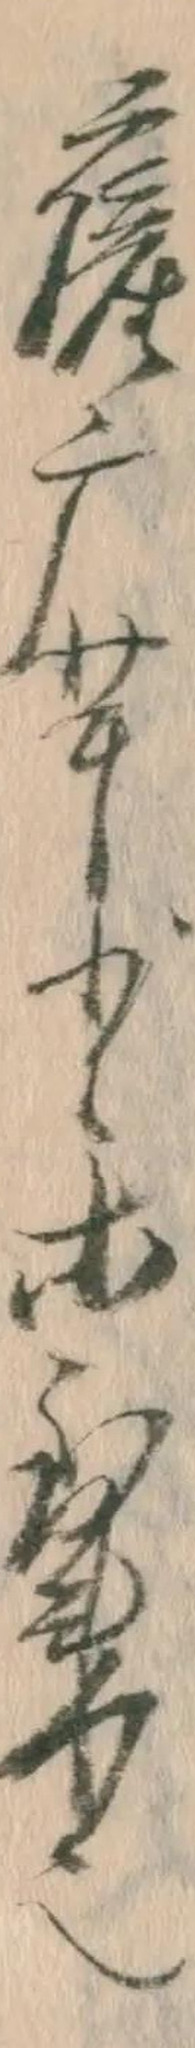薩摩芋少〻等到来也
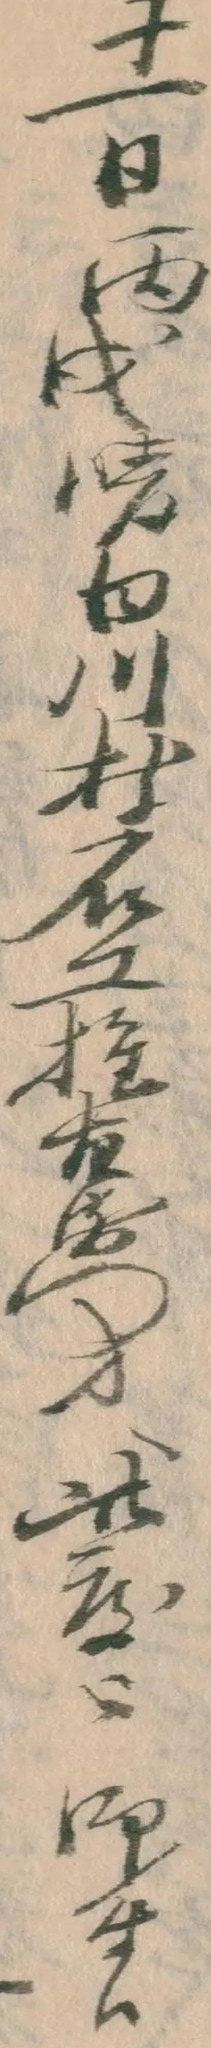十一日丙戌晴白川村石工権左衛門方へ此度被仰付候
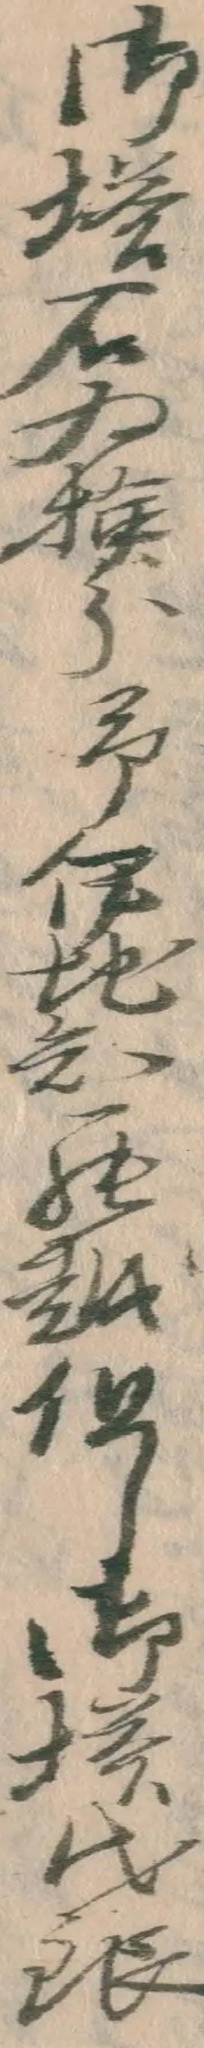御塔石為検分予伊地知罷越但し御譜代銀
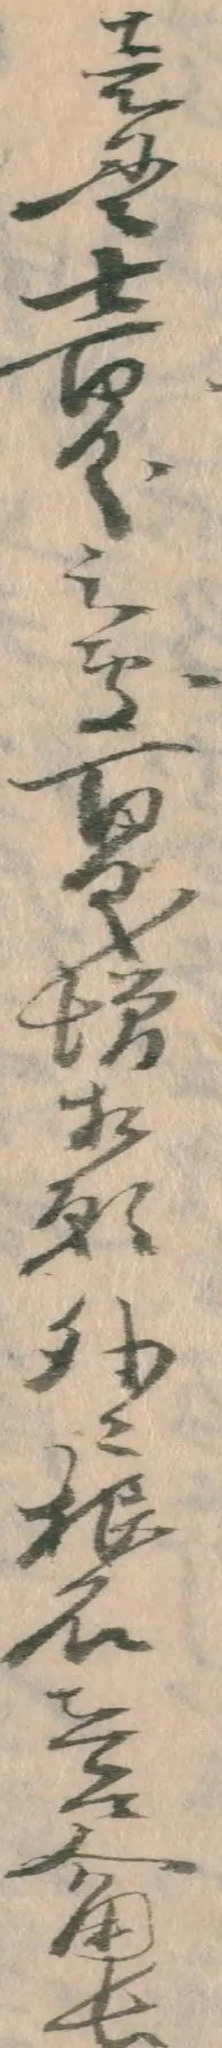壱貫七百匁之處百匁増相願外ニ根石壱え人角長
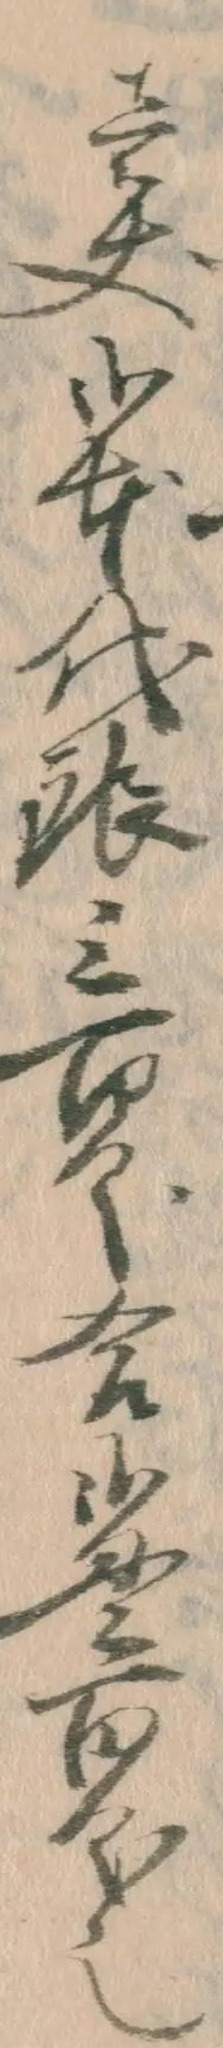壱丈弐本代銀三百匁合弐貫百匁之
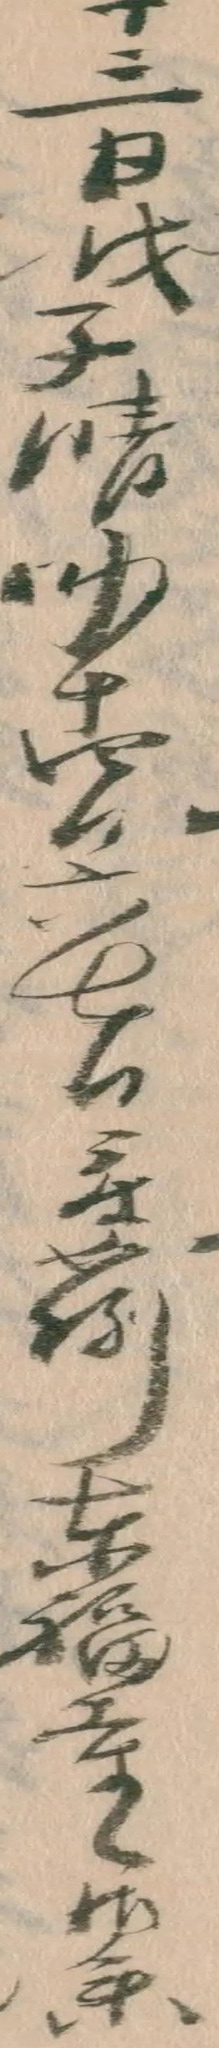十三日戊子晴明十四日六七日ニ付如例東福寺へ御参
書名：賀茂社記録. 第67冊
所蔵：国立国会図書館 National Diet Library, JAPAN
